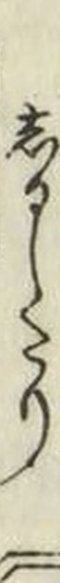しるしたり
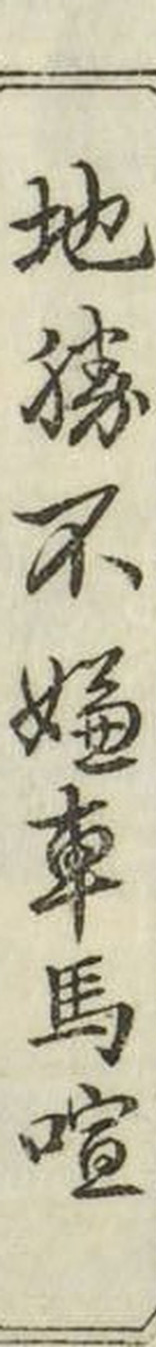地勝不嫌車馬喧
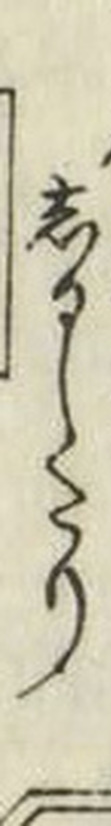しるしたり
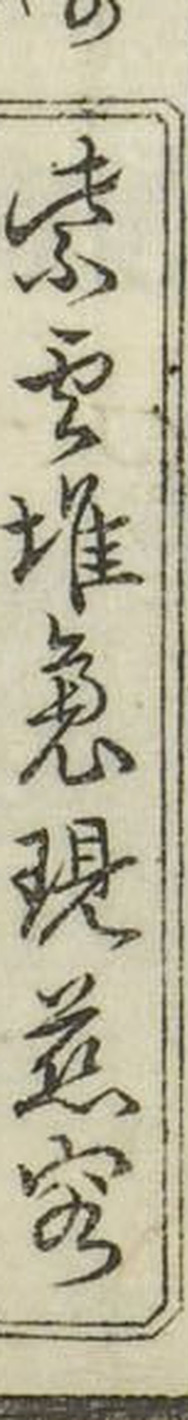紫雲堆慮現慈究
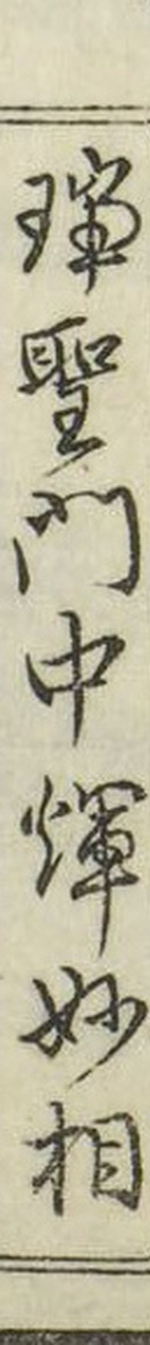瑞聖門中輝妙相

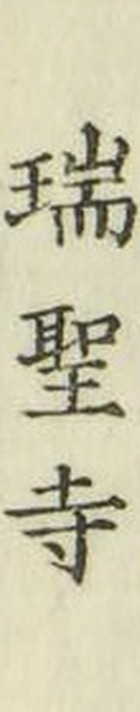瑞聖寺

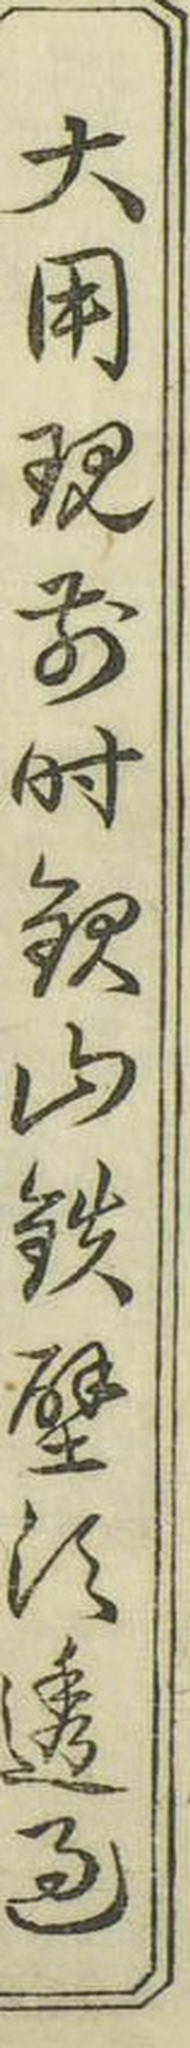大用現前時銀山鉄壁須透過
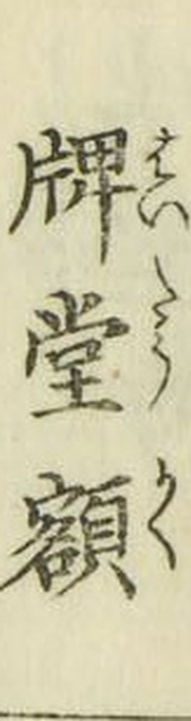牌堂額
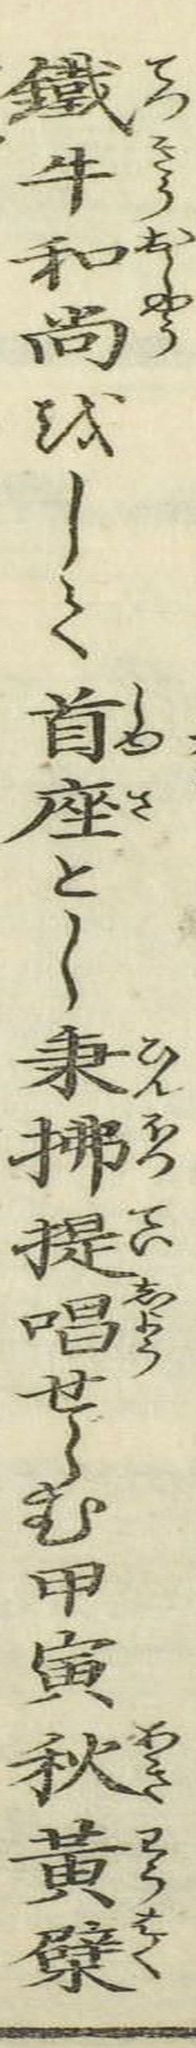鐵牛和尚をして首座とし秉佛提唱せしむ甲寅秋黄檗
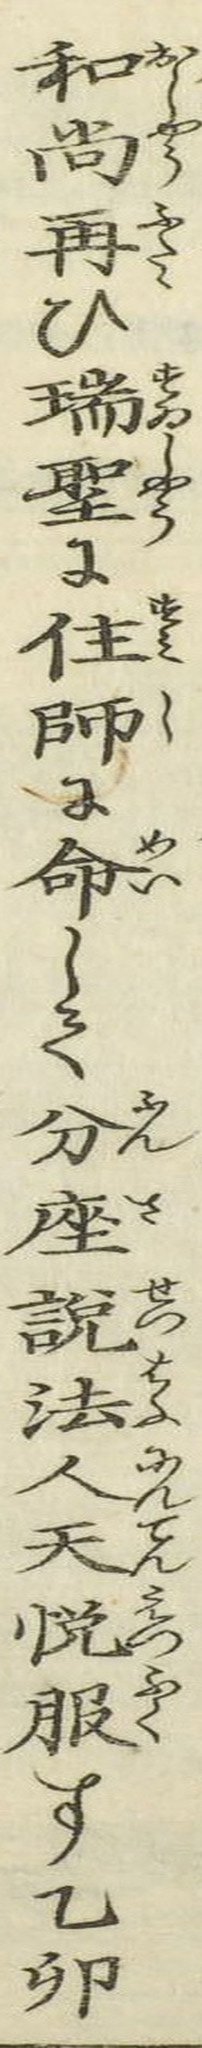和尚再ひ瑞聖に住師に命して分座説法人天悦服す乙卯
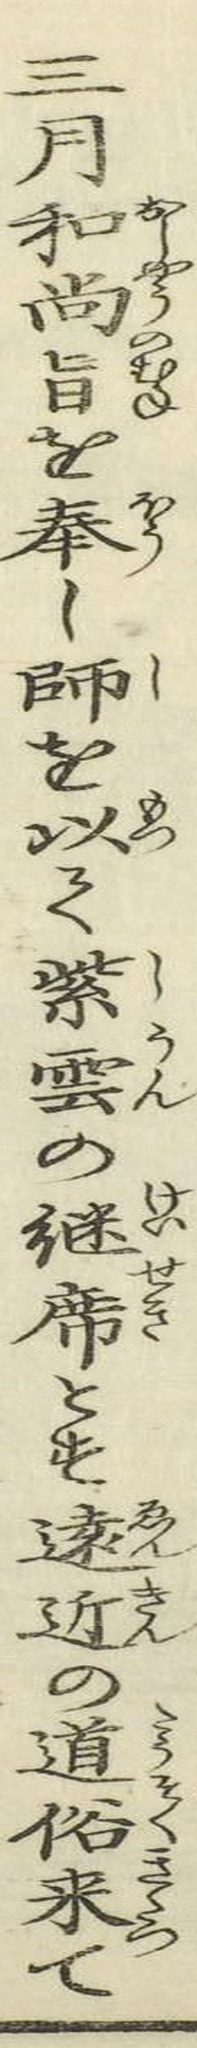三月和尚旨を奉し師を以て紫雲の継席とす遠近の道俗来て
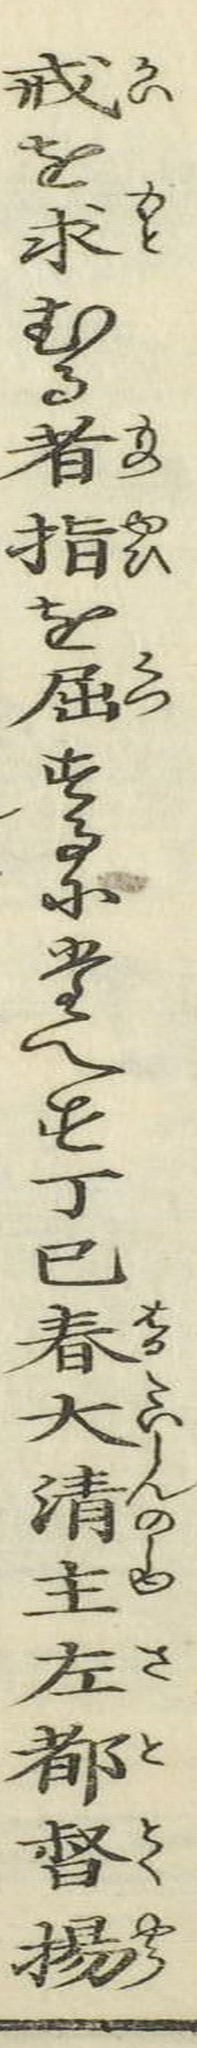戒を求むる者指を屈するにたへす丁巳春大清主左都督楊
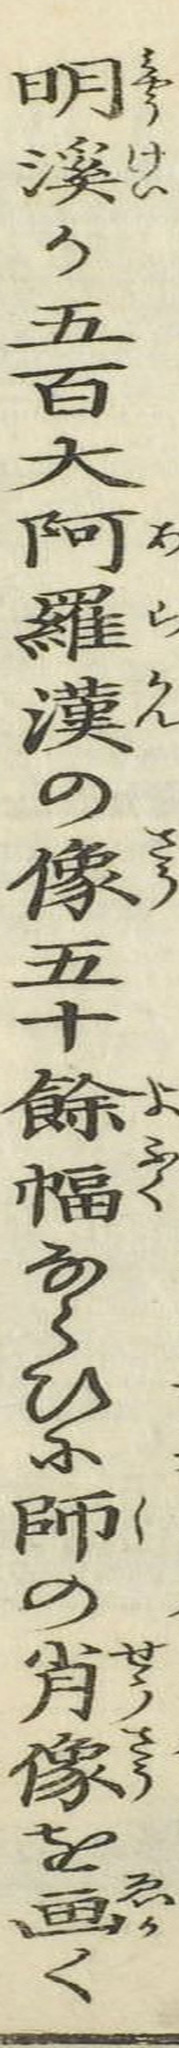明溪か五百大阿羅漢の像五十餘幅ならひに師の肖像を画く
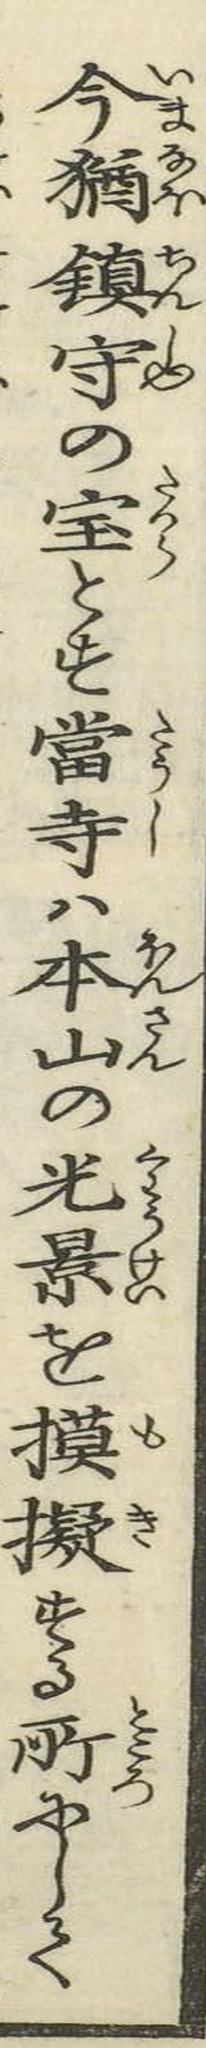今猶鎮守の宝とす當寺は本山の光景を摸擬する所にして
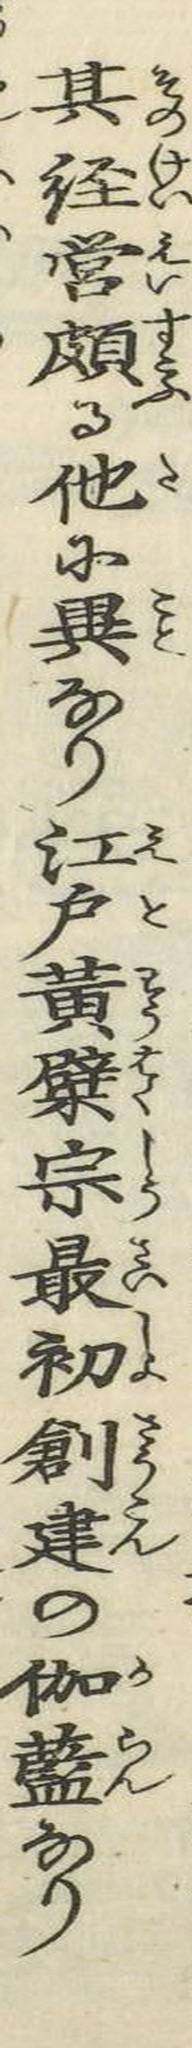其経営頗る他に異なり江戸黄檗宗最初創建の伽藍なり
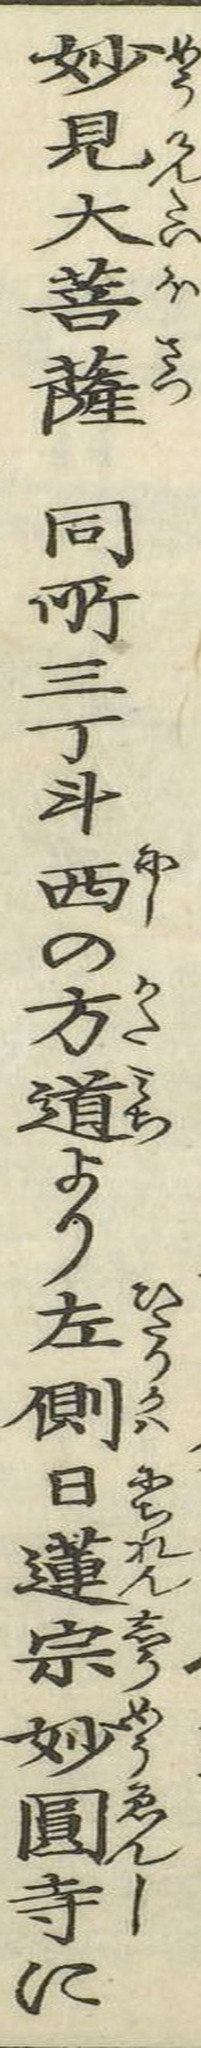妙見大菩薩同所三丁斗西の方道より左側日蓮宗妙圓寺に
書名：江戸名所図会 20巻 巻之7
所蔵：東京学芸大学教育コンテンツアーカイブ
